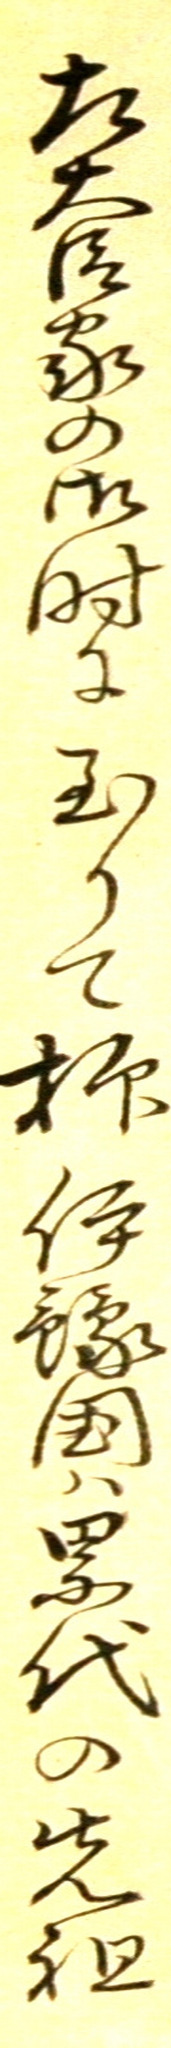左大臣家の御時に至りて抑伊予国は累代の先祖

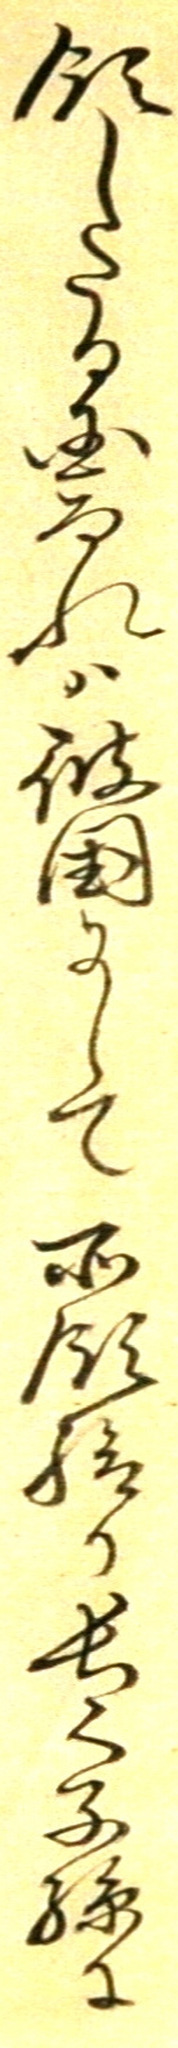領したる国なれは彼国にして所領給り長く子孫に
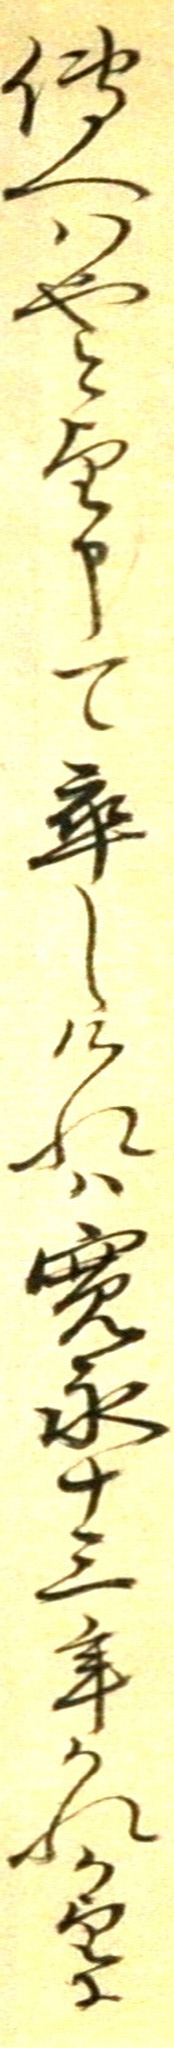伝へはやと望申て卒しけれは寛永十三年かれか望に
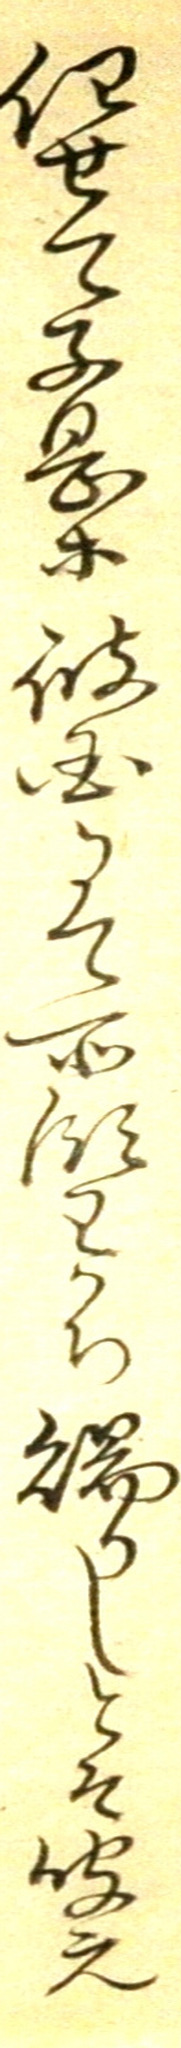任せて子息等彼国にて所領わかち賜りしとそ聞え
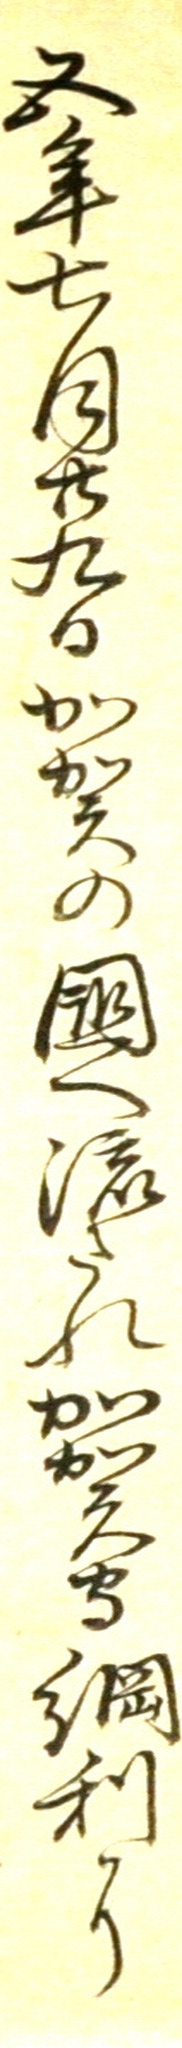五年七月廿九日加賀の国へ流され加賀守綱利に
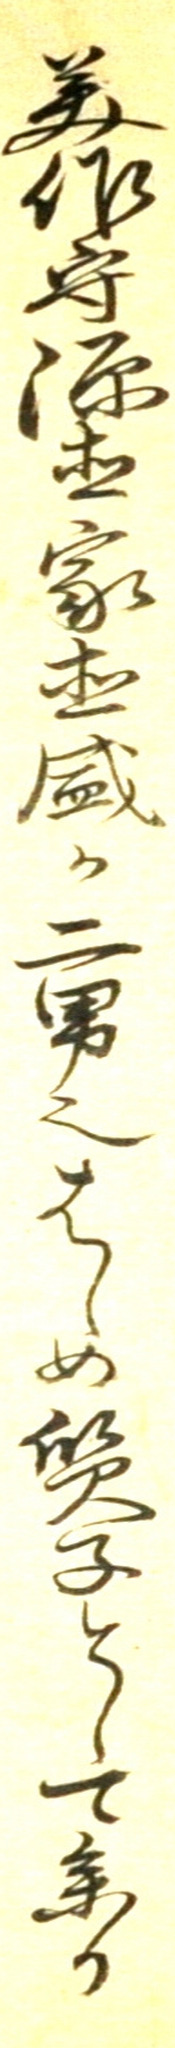美作守源直家直盛か二男也はしめ質子として参り
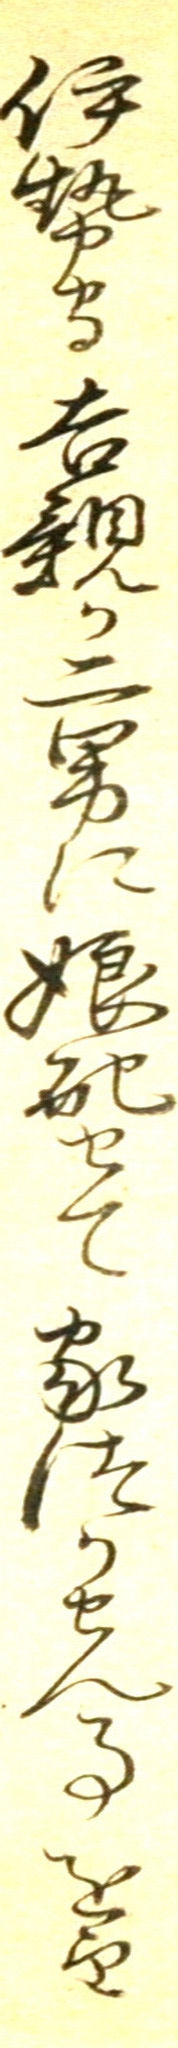伊勢守吉親か二男に娘配せて家つかせん事を望
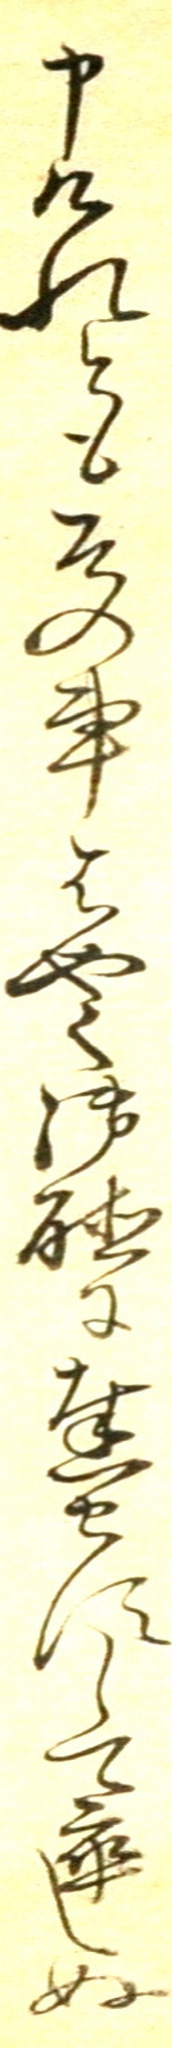申けれともその事はやく御聴に達せすして卒しぬ
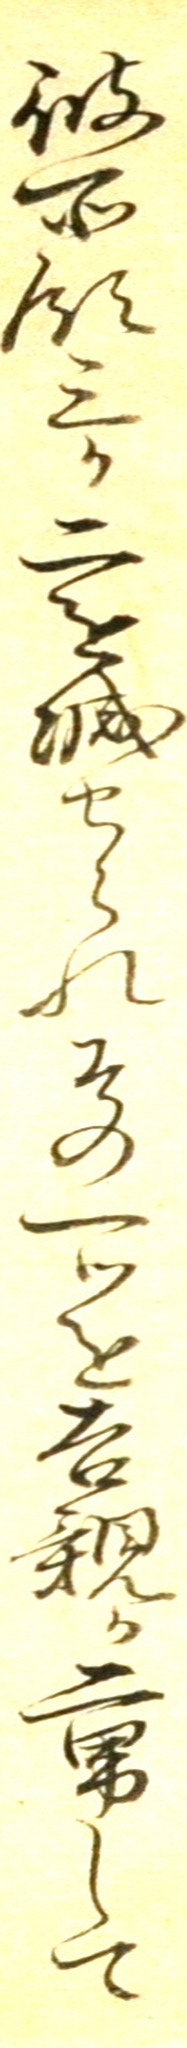彼所領三か二を減せられその一ツを吉親か二男して

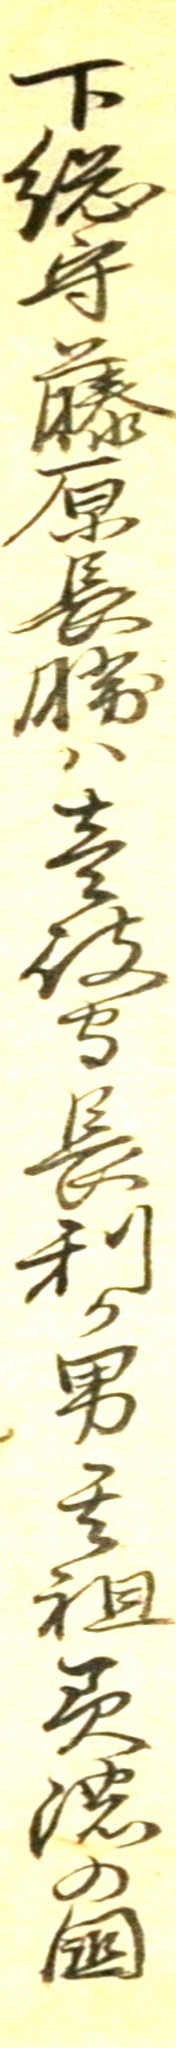下総守藤原長勝は壱岐守長利か男其祖美濃の国
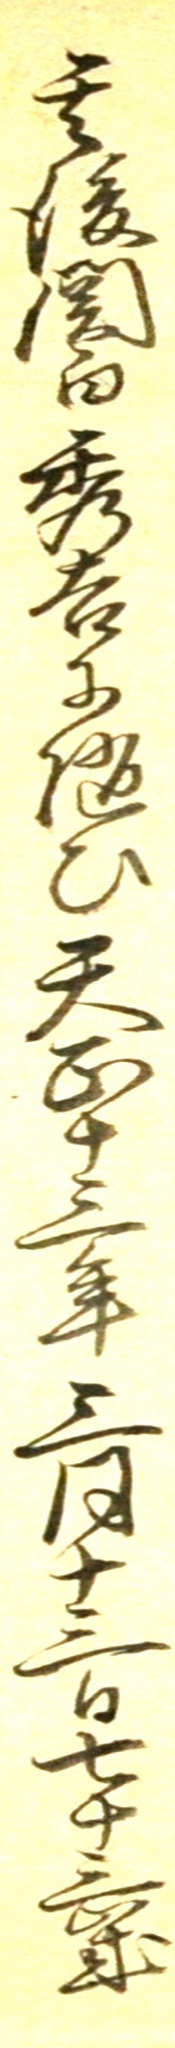其後関白秀吉に随ひ天正十三年三月十三日七十三歳
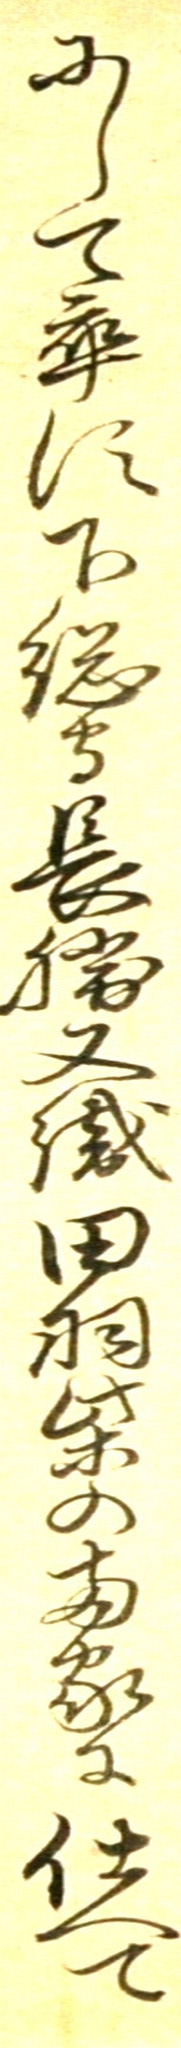にして卒す下総守長勝又織田羽柴の両家に仕へて
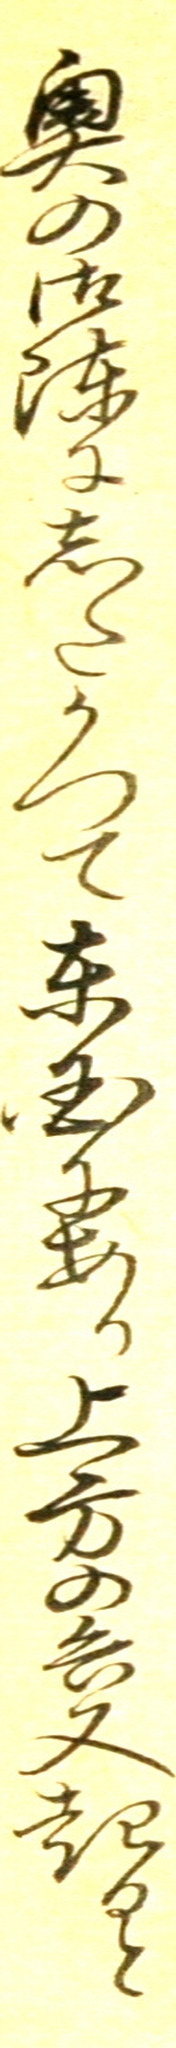奥の御陣にしたかつて東国にあり上方の兵又起ると

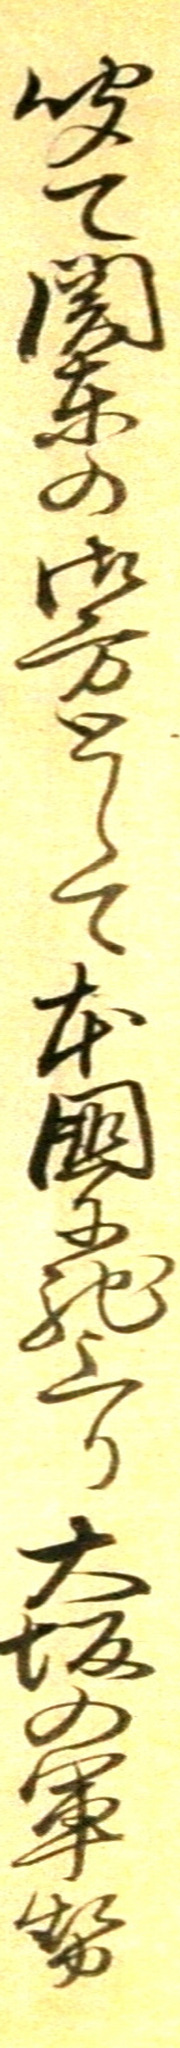聞て関東の御方として本国に馳上り大坂の軍勢
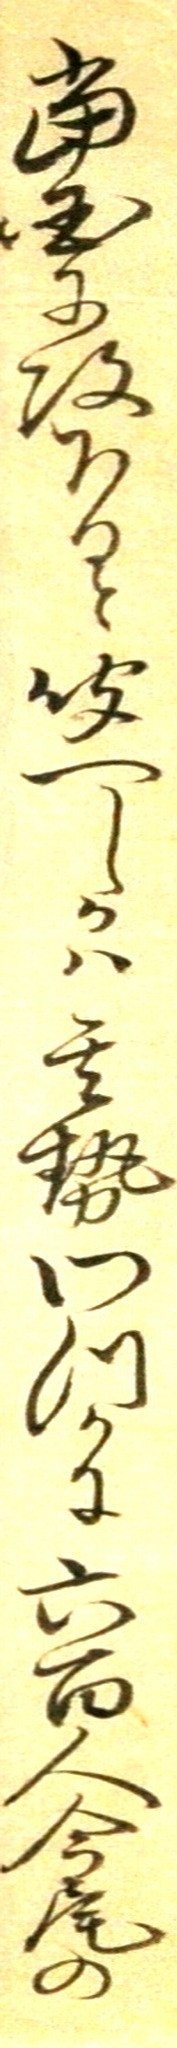当国に攻下ると聞へしかは其勢わつかに六百人今尾の
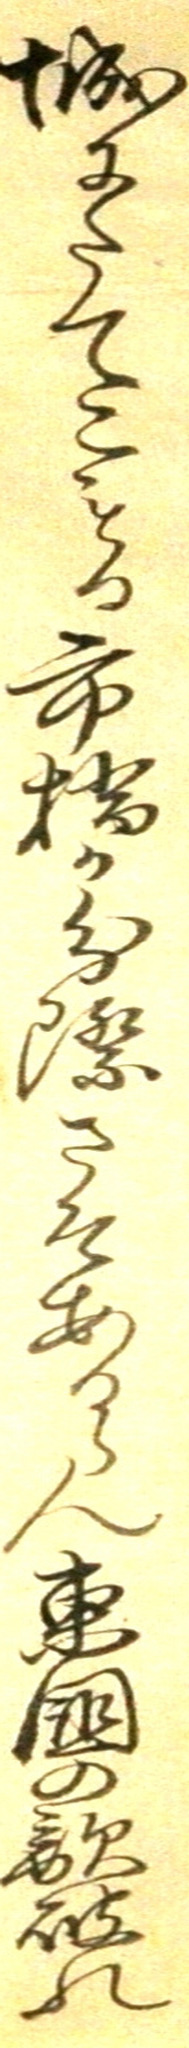城にたてこもる市橋か分際さそあるらん東国の敵破れ
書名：藩翰譜（九・上）
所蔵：伊那市立高遠町図書館・合同会社AMANE
